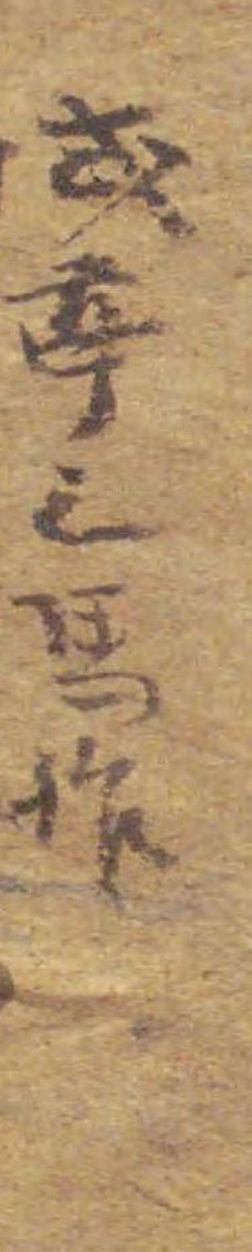式亭三馬作
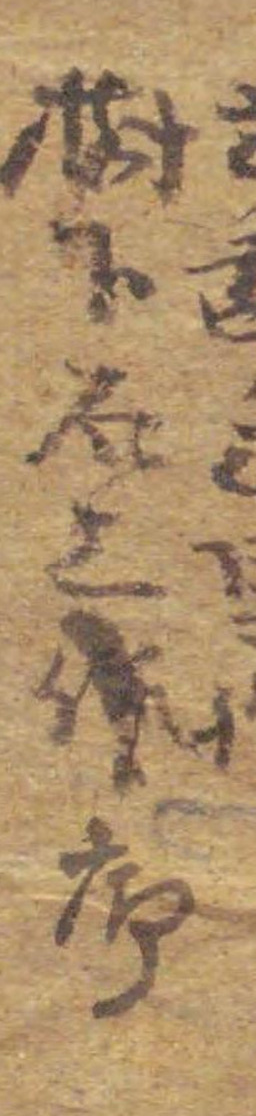樹下石上作序
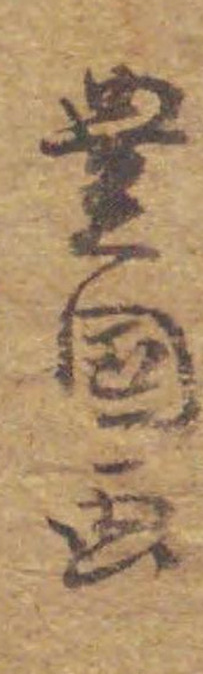豊国画

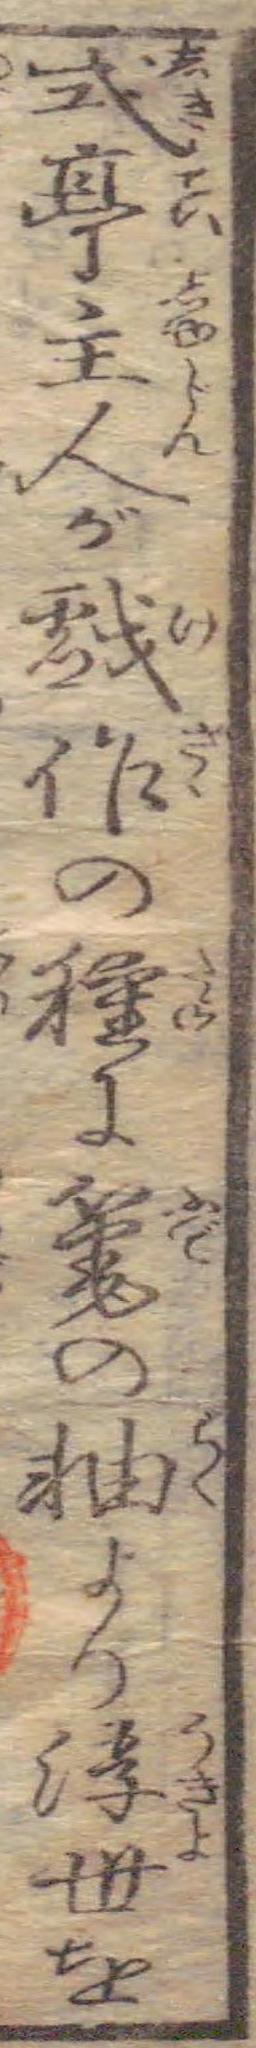式亭主人が戯作の種に筆の軸より浮世を
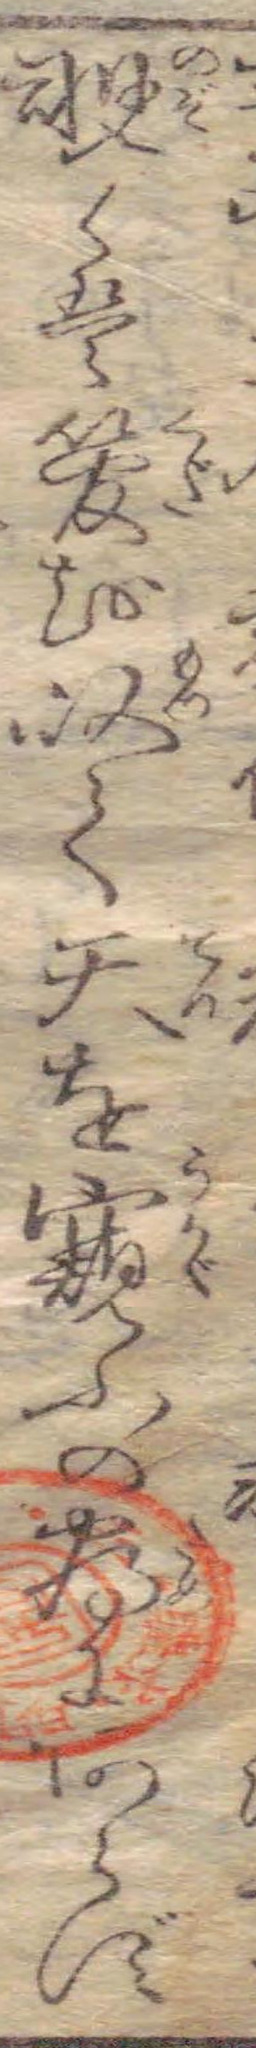覗くは管を以て天を窺ふの為にあらず
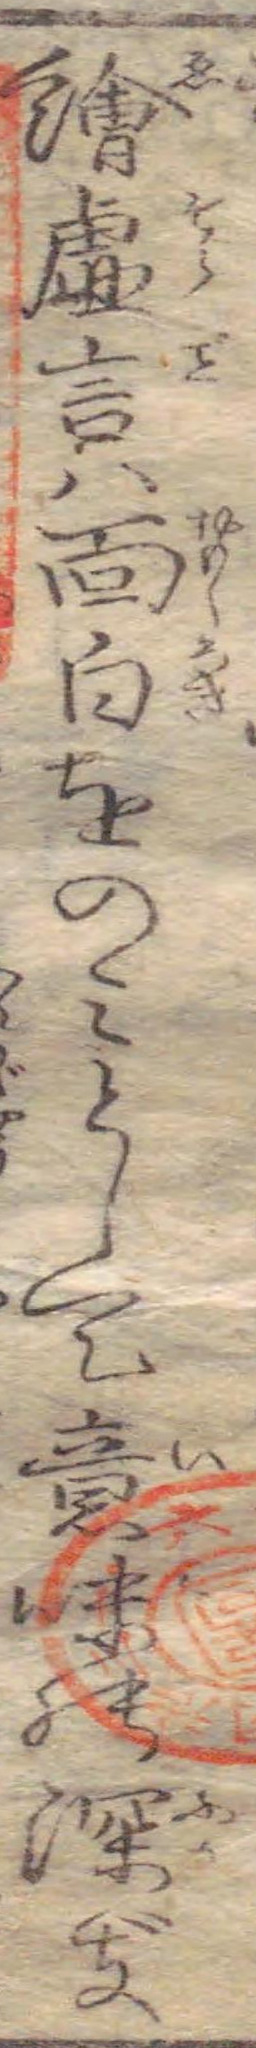絵虚言は面白をのみとして意味の深ぎ
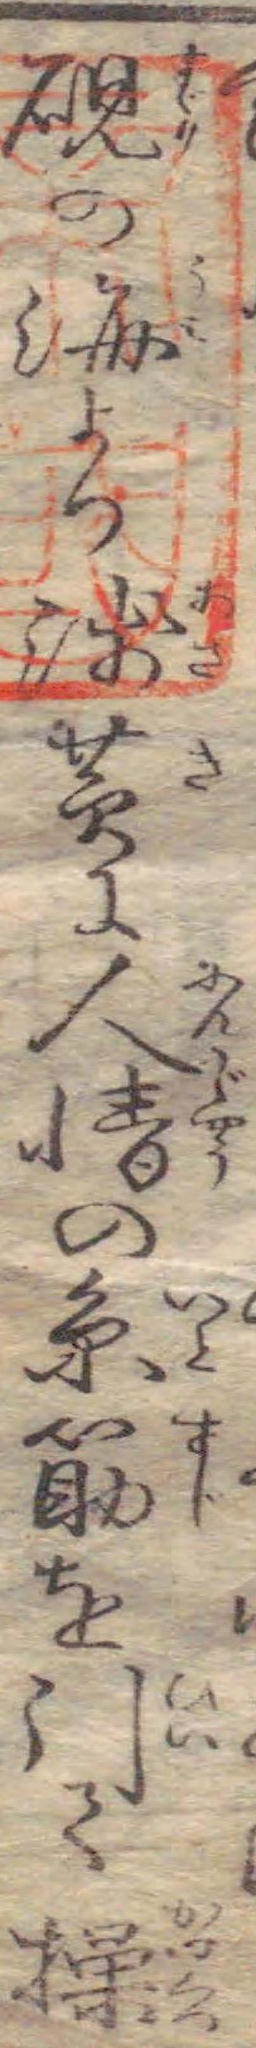硯の海より浅黄に人情の糸筋を引て操
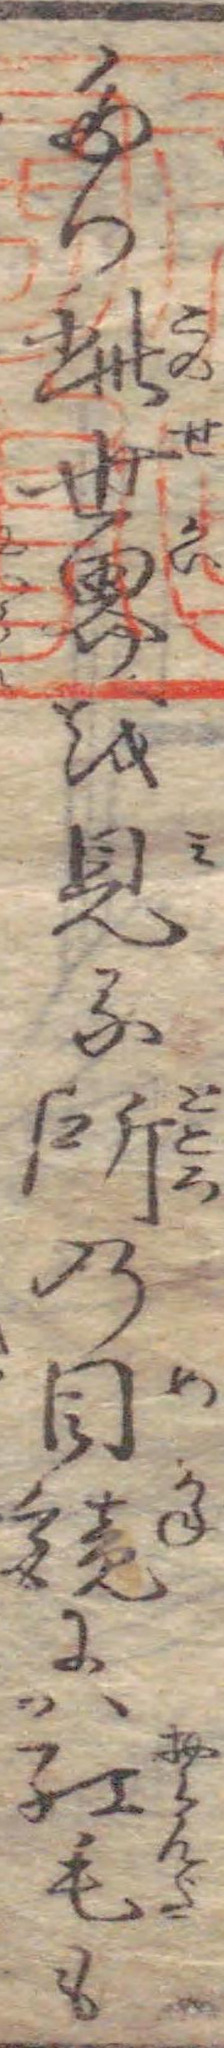たり此世界を見る所の目＋鏡には紅毛も
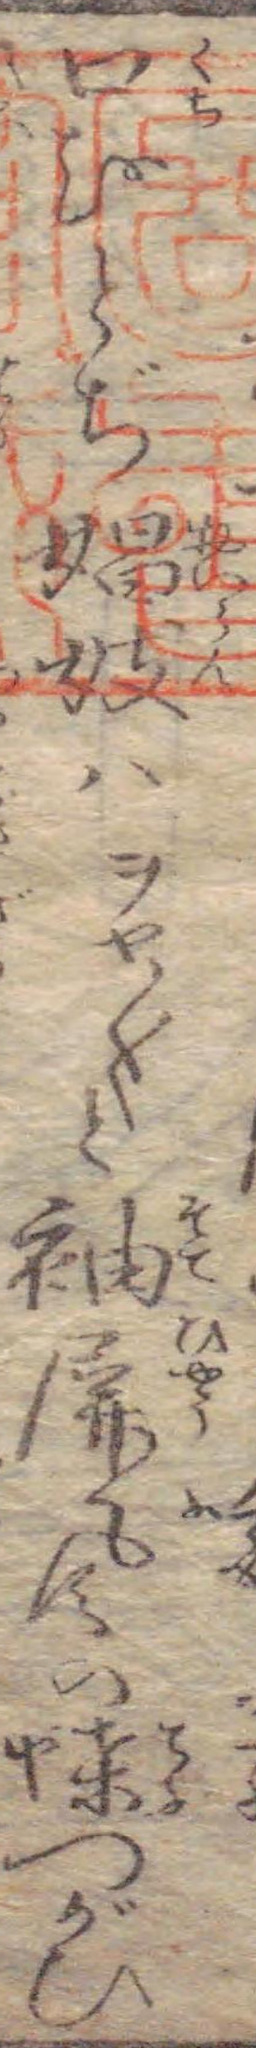口をとぢ娼妓はヲヤ〳〵〳〵と袖屏風の蝶つがひ
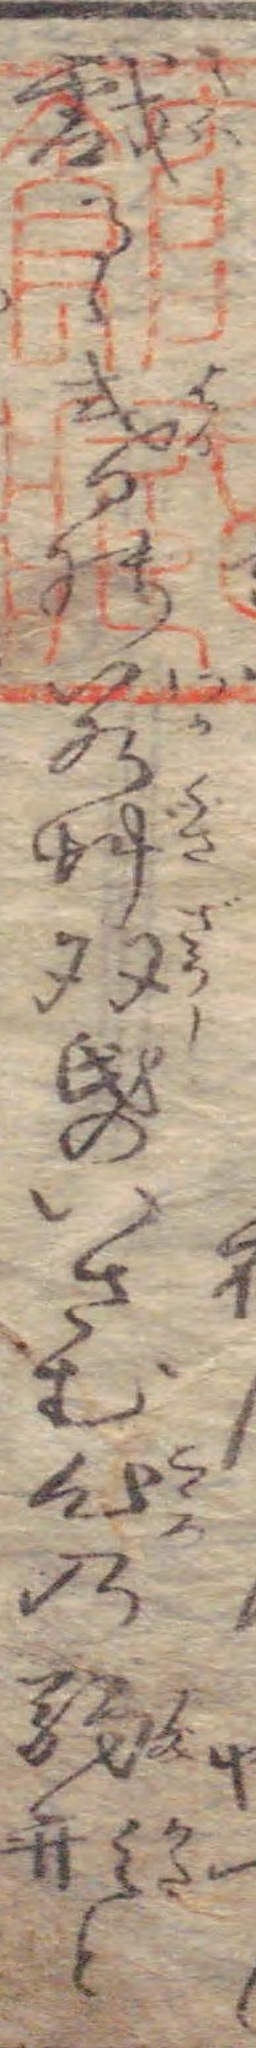戯るゝ春の若艸双紙いさむ心の駒形と
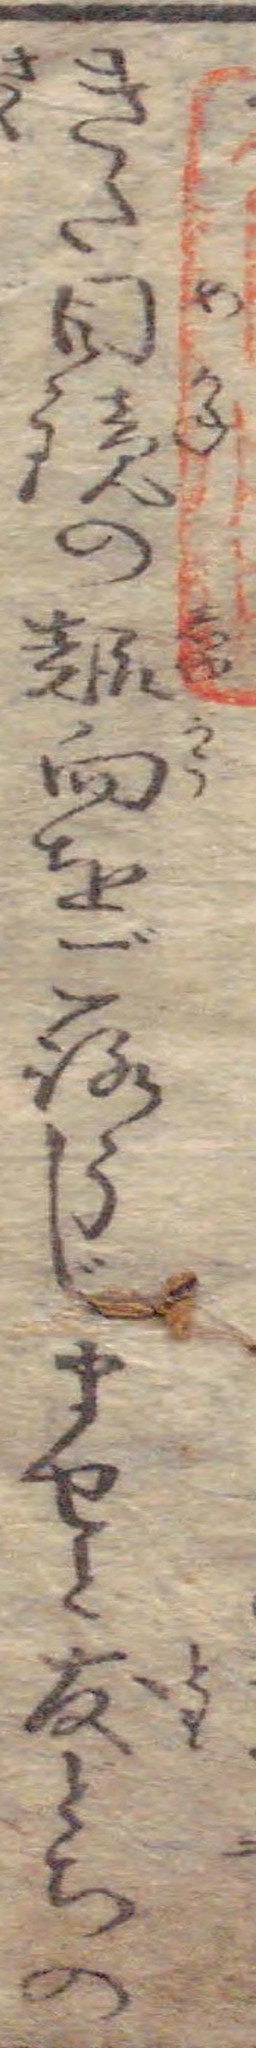きた目鏡の趣向をごろうじませと友とちの
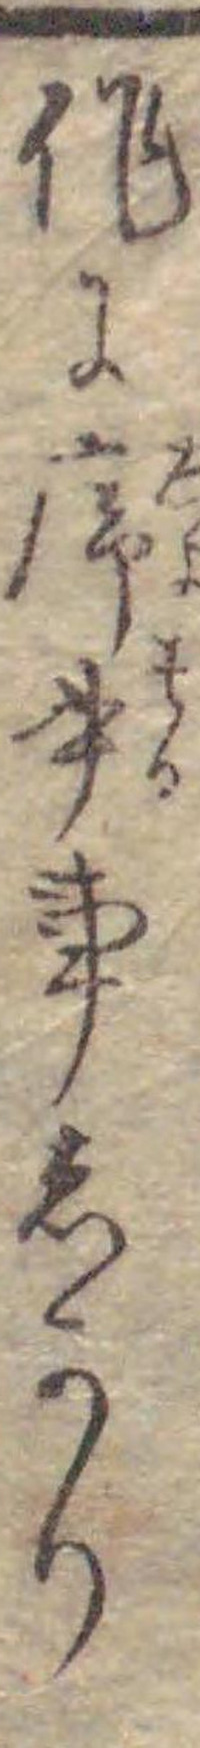作に序書事しかり

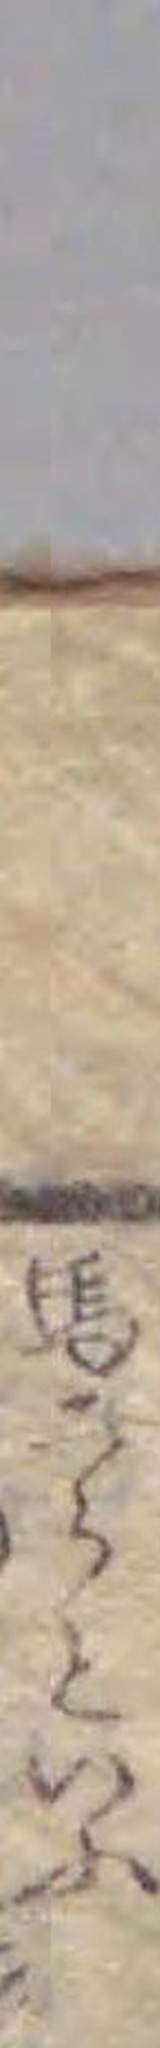馬二郎といふ
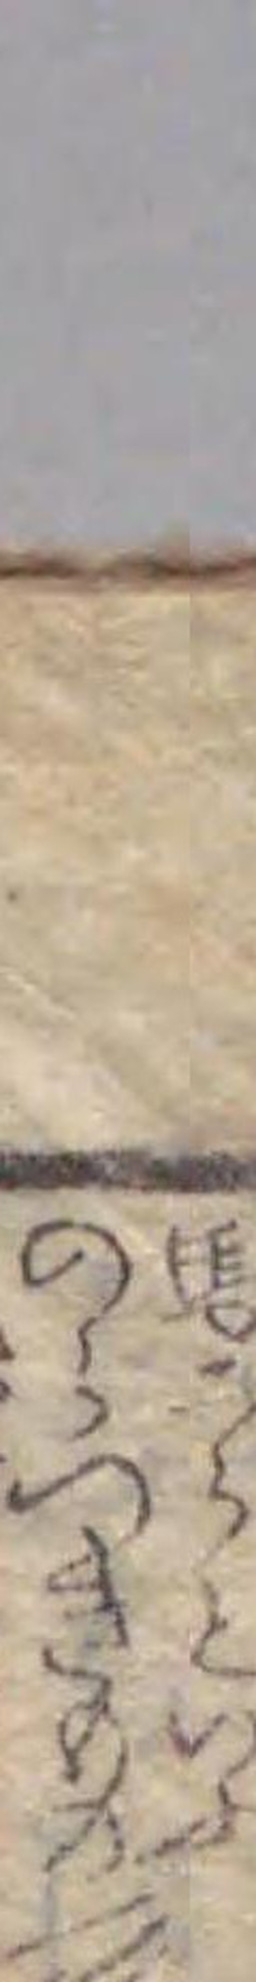のらつきもの
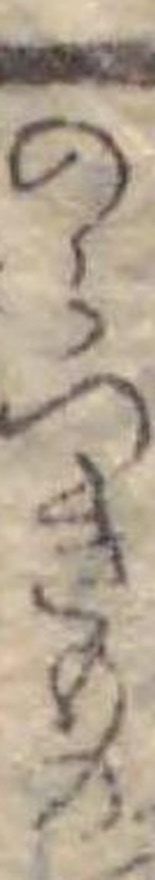のらつきもの
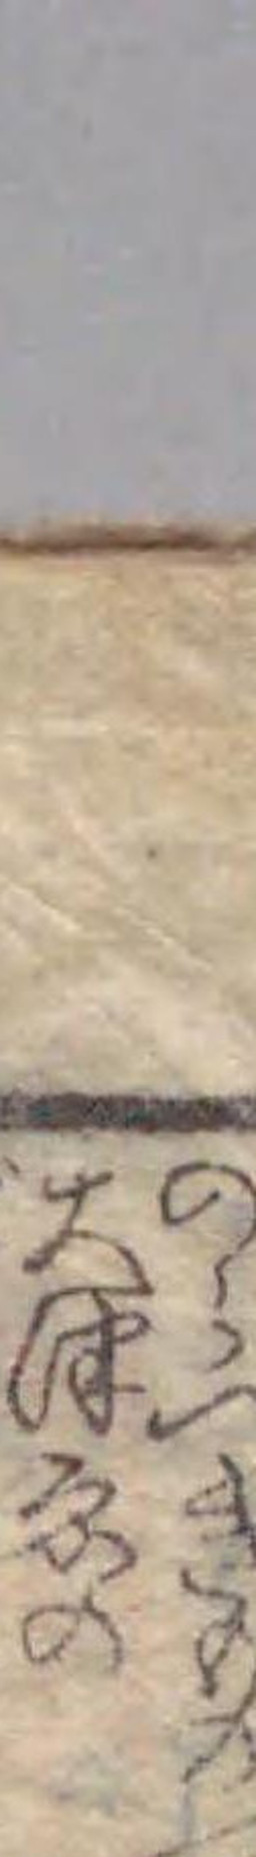大津ゑの
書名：人間一心覗替繰 : 2巻
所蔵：国立国会図書館 National Diet Library, JAPAN
